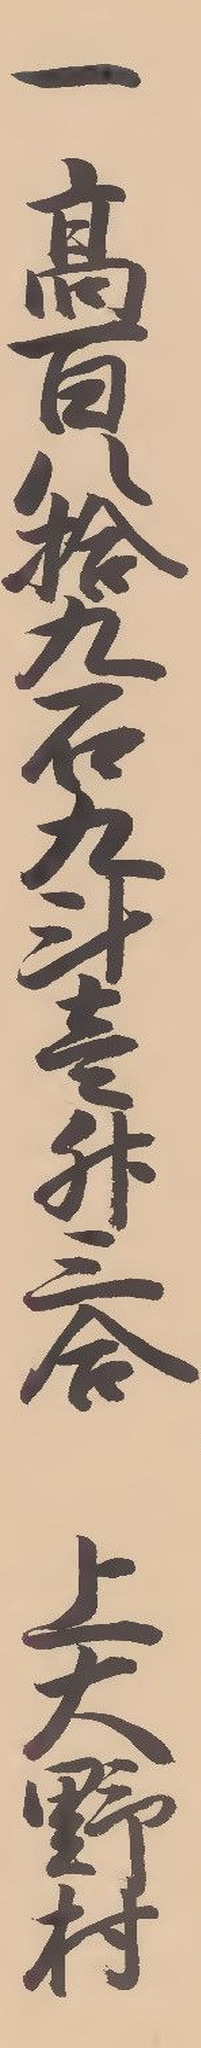一高百八拾九石九斗壱升三合上大野村

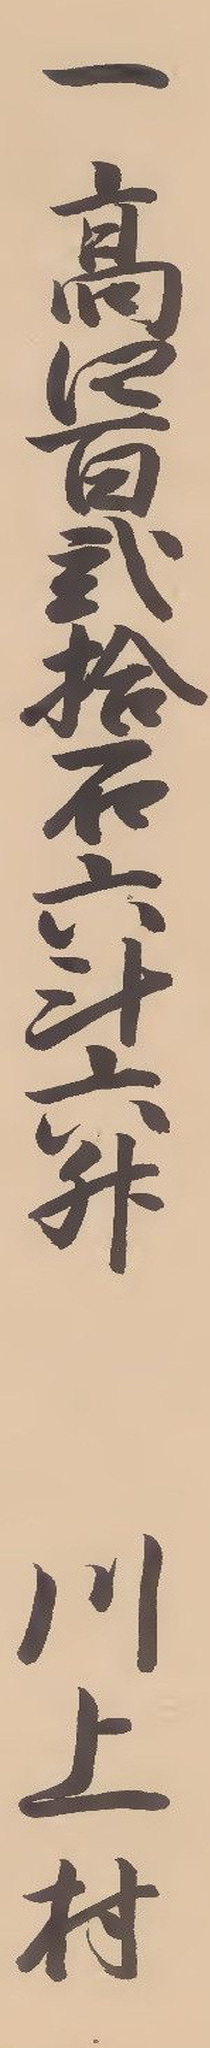一高四百弐拾石六斗六升川上村
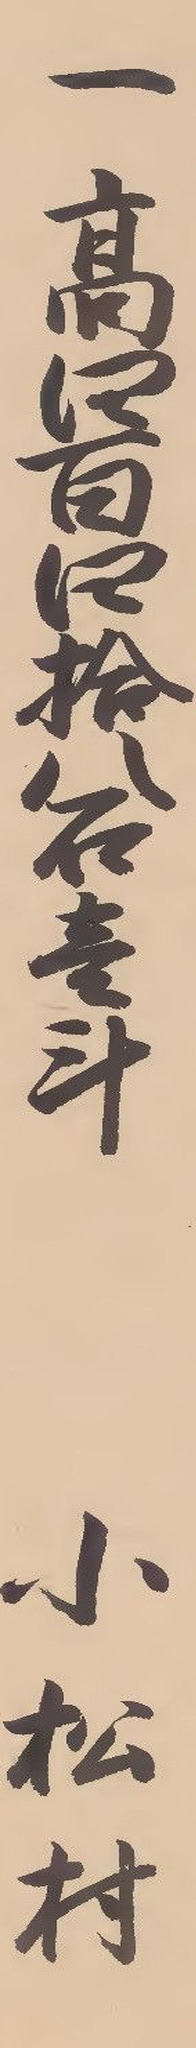一高四百四拾八石壱斗小松村
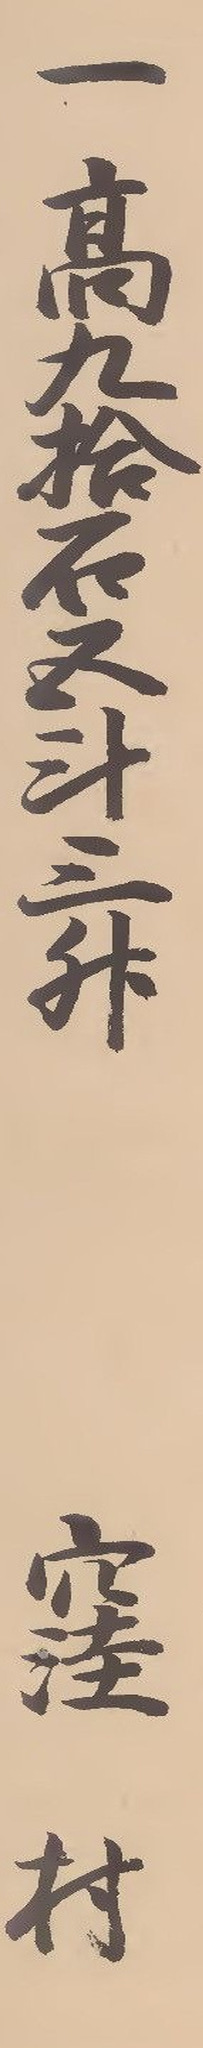一高九拾石五斗三升窪村
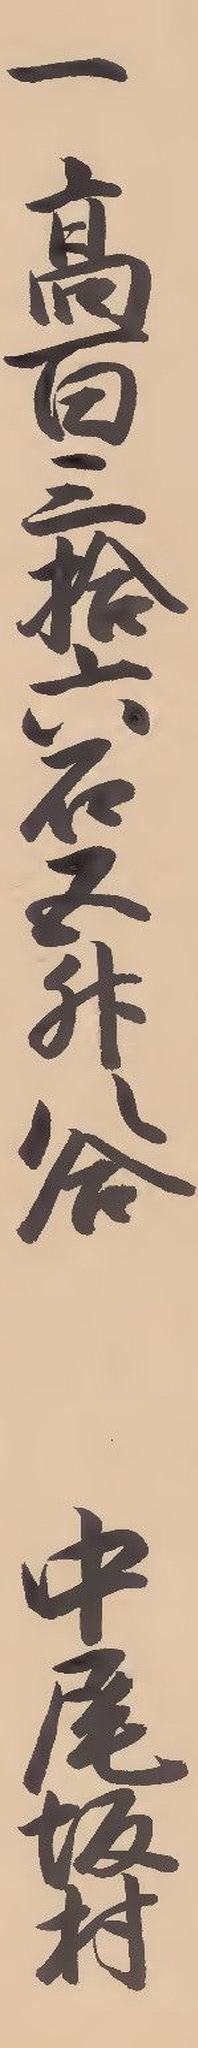一高百三拾六石五升八合中尾坂村
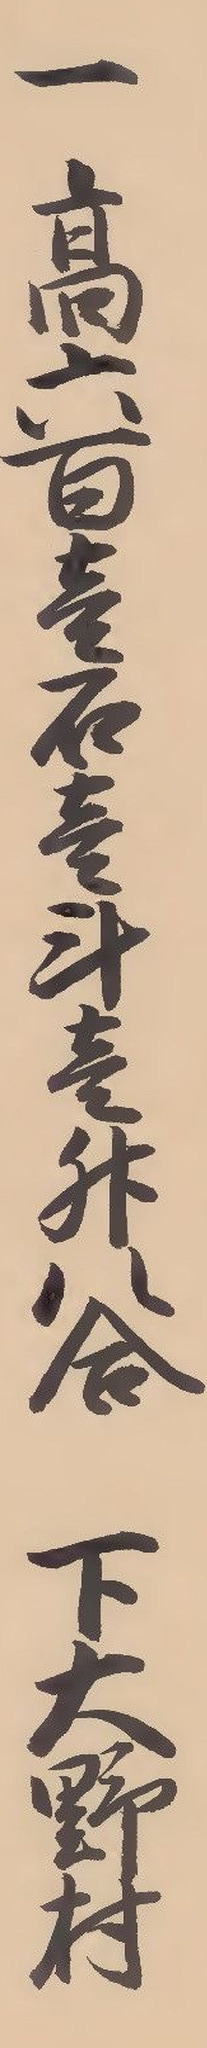一高六百壱石壱斗壱升八合下大野村
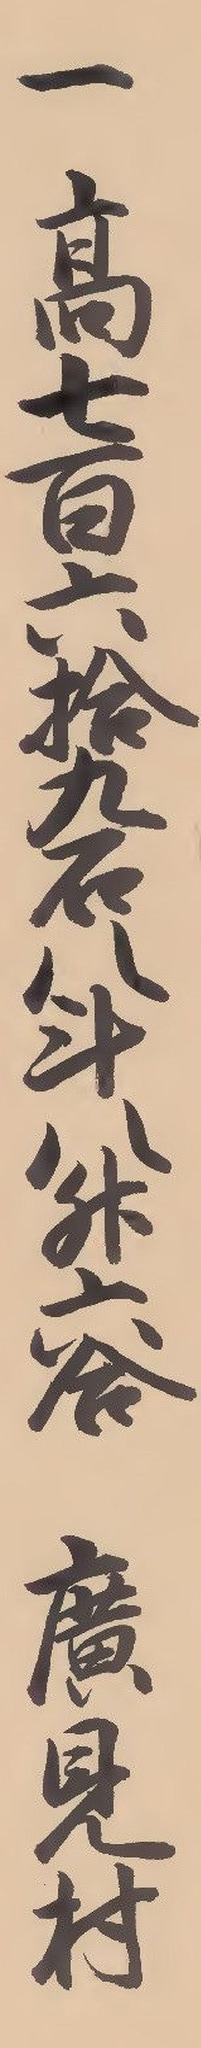一高七百六拾九石八斗八升六合広見村

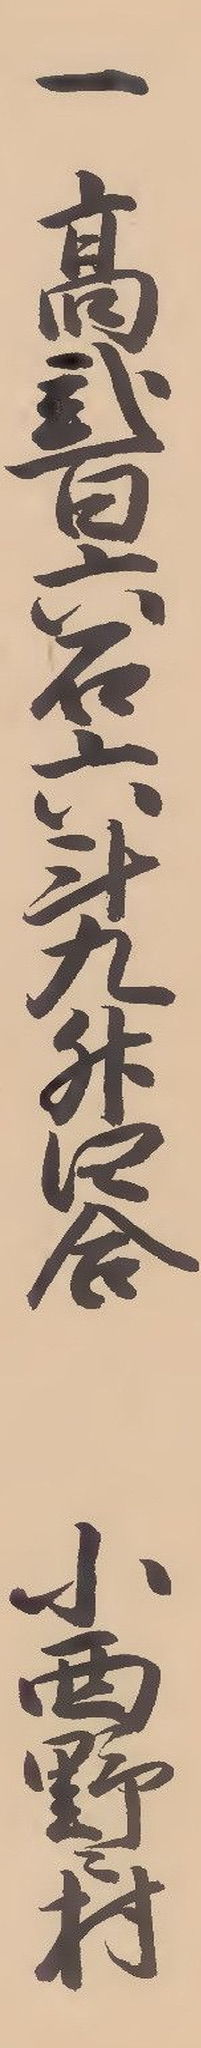一高弐百六石六斗九升四合小西野々村
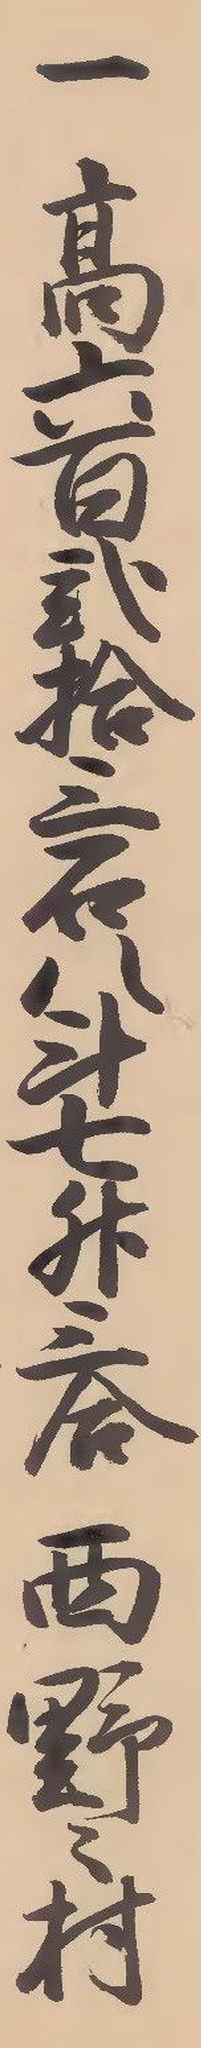一高六百弐拾三石八斗七升三合西野々村
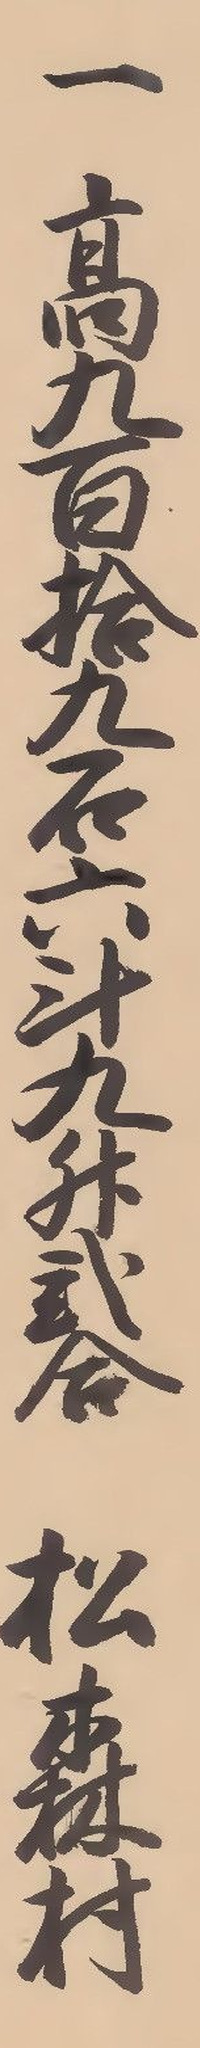一高九百拾九石六斗九升弐合松森村
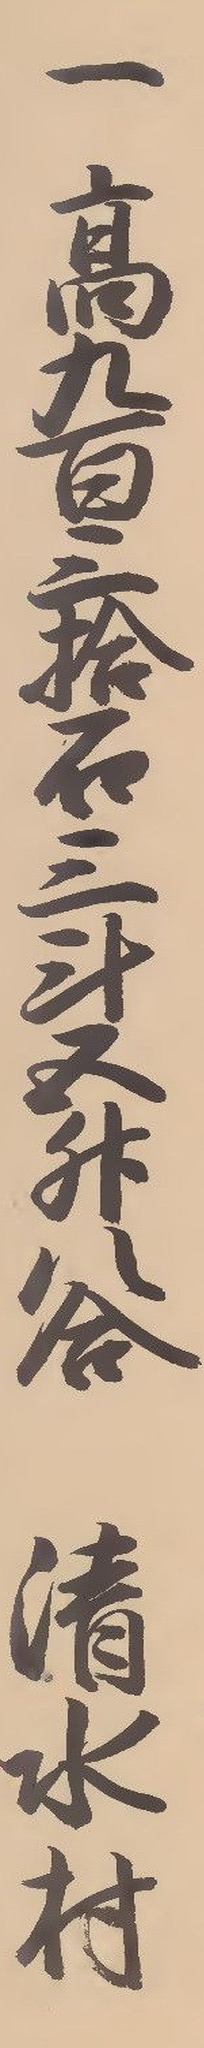一高九百三拾石三斗五升八合清水村
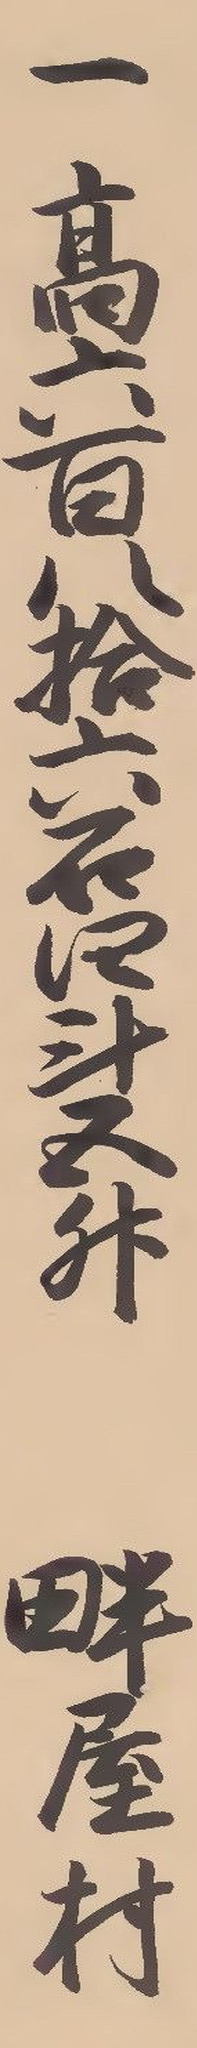一高六百八拾六石四斗五升畔屋村
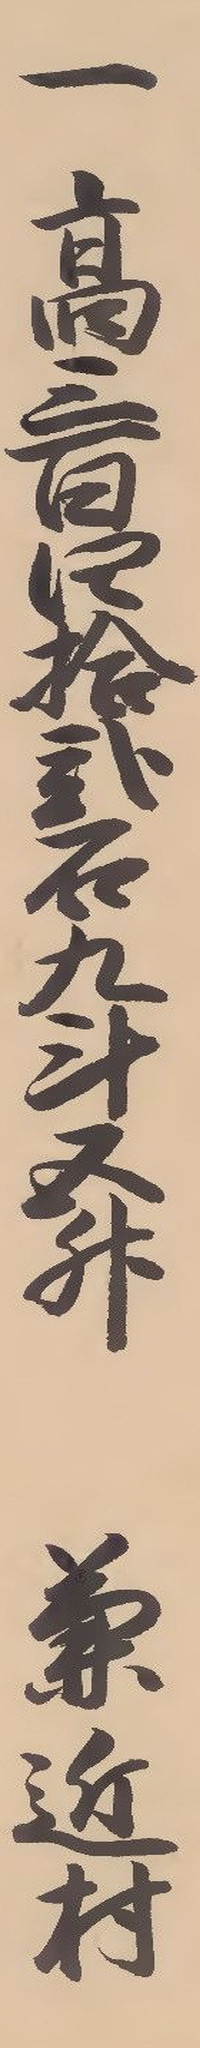一高三百四拾弐石九斗五升兼近村
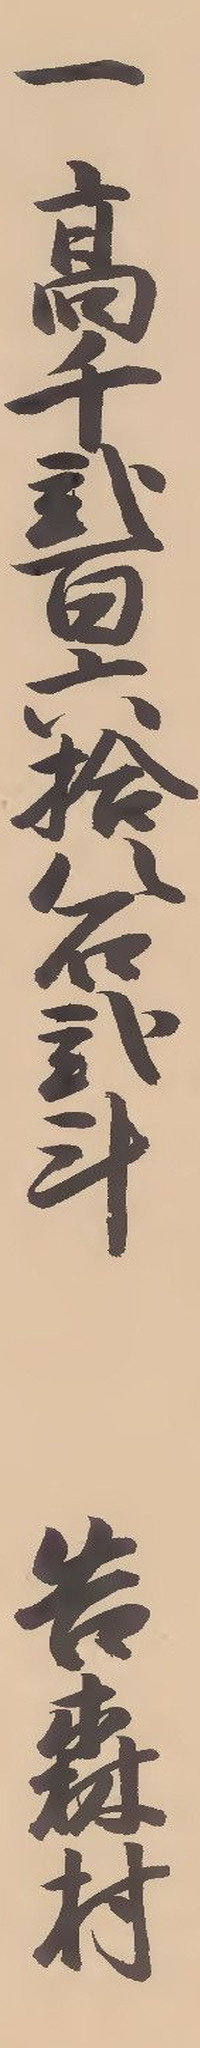一高千弐百六拾八石弐斗告森村
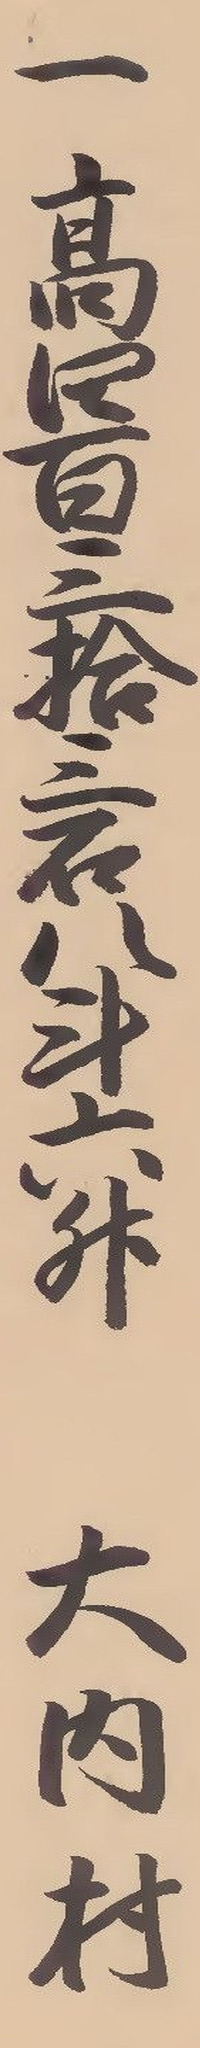一高四百三拾三石八斗六升大内村

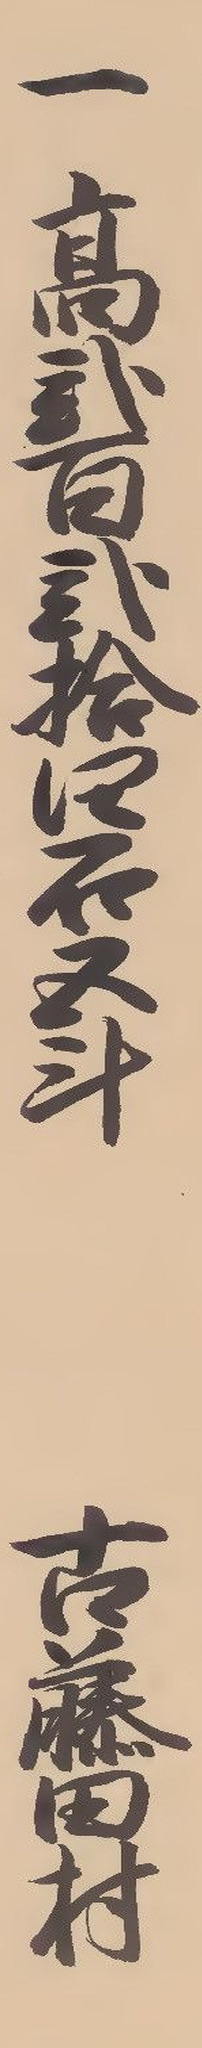一高弐百弐拾四石五斗古藤田村
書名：伊予国郷帳
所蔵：国立公文書館 National Archives of Japan
